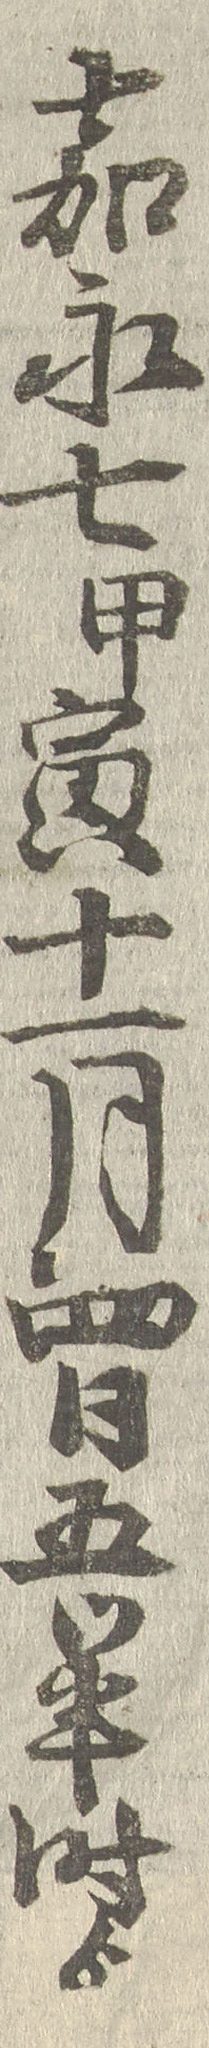嘉永七甲寅十一月四日五つ半時より
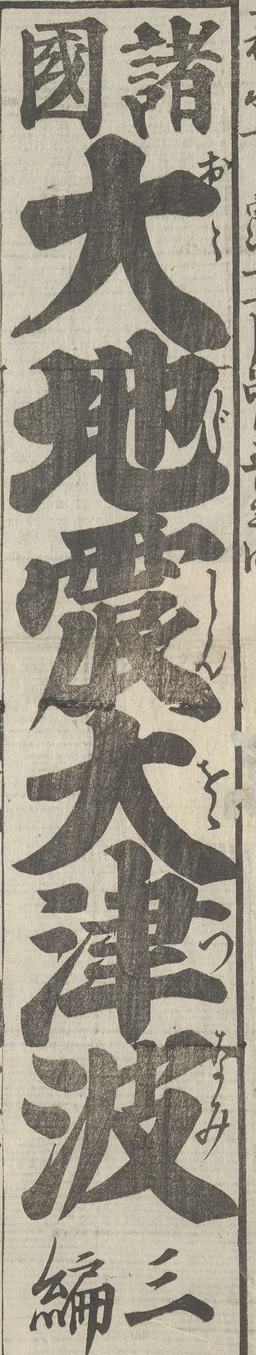諸国大地震大津波三編
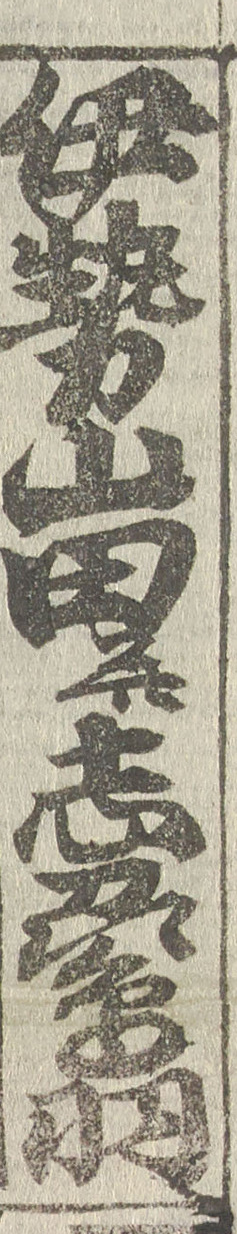伊勢山田并志州鳥羽
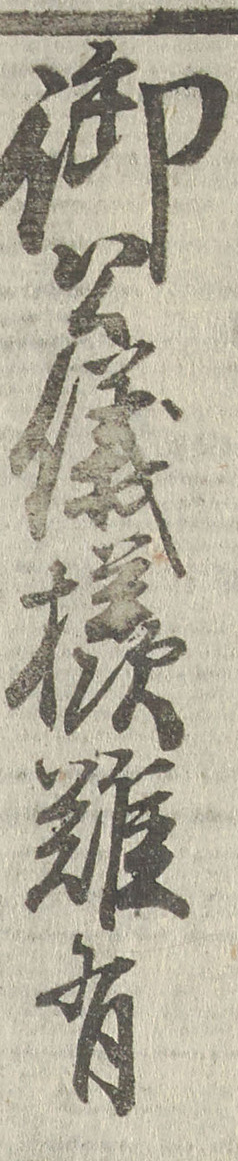御公儀様難有
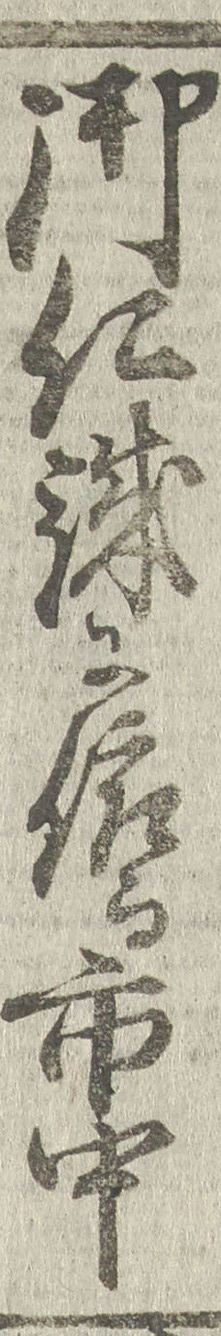御仁誠に依て市中
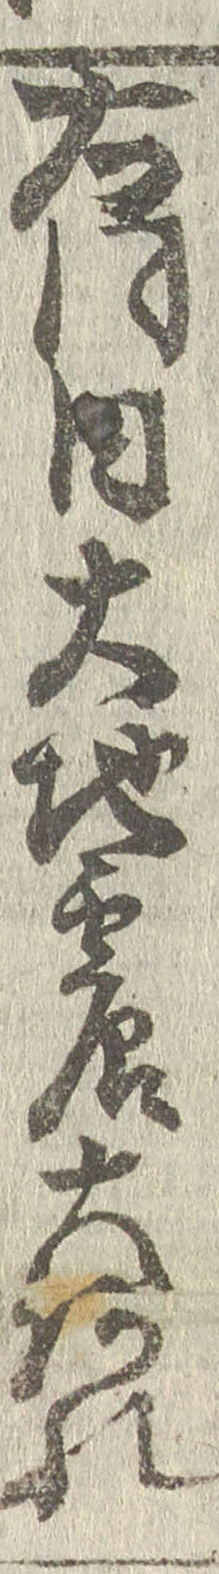右同日大地震大あれ
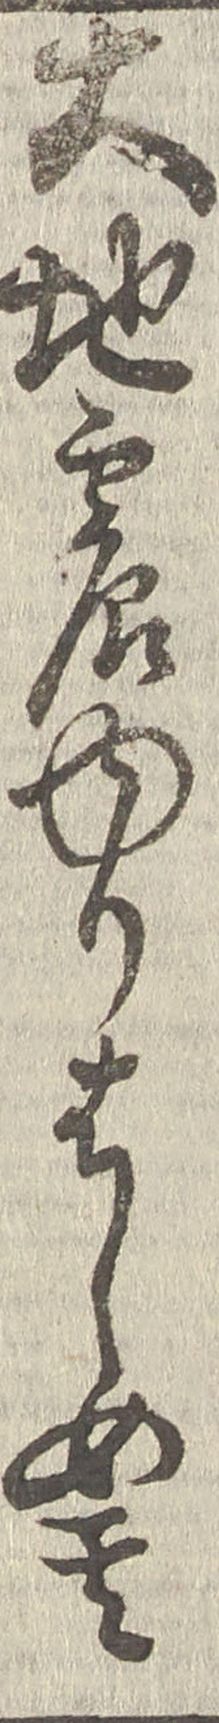大地震ゆりはしめ其
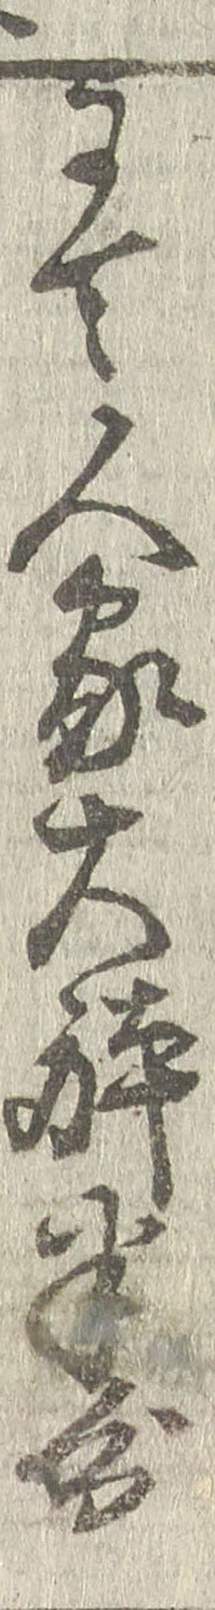にて人家大躰半分
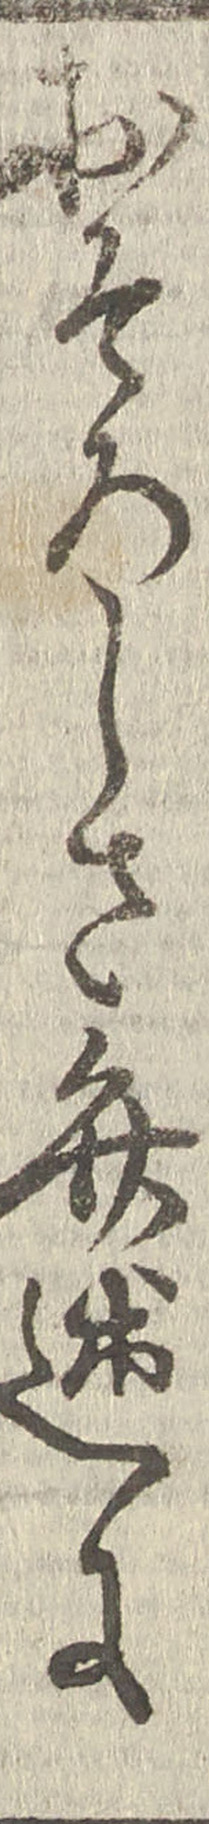おそをしさ弁述に
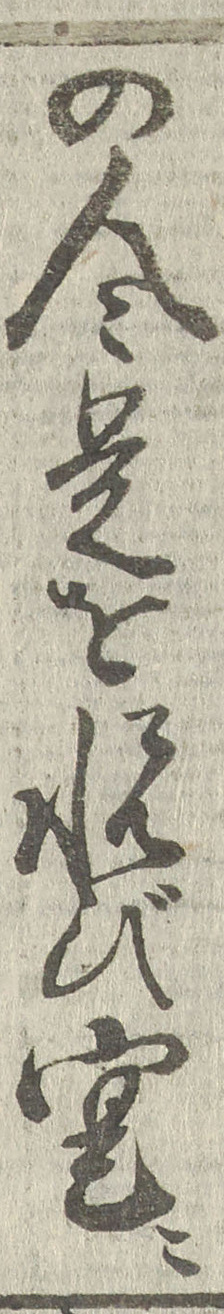の人々是を悦び寔に
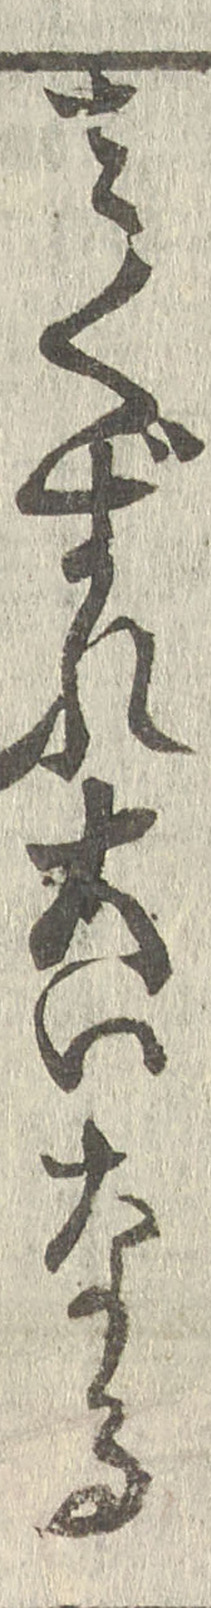はくずれ大いなる
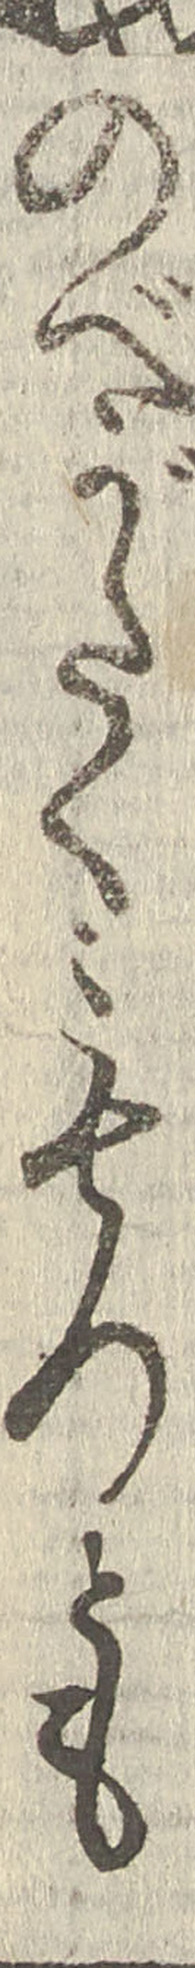のべがたくもつとも
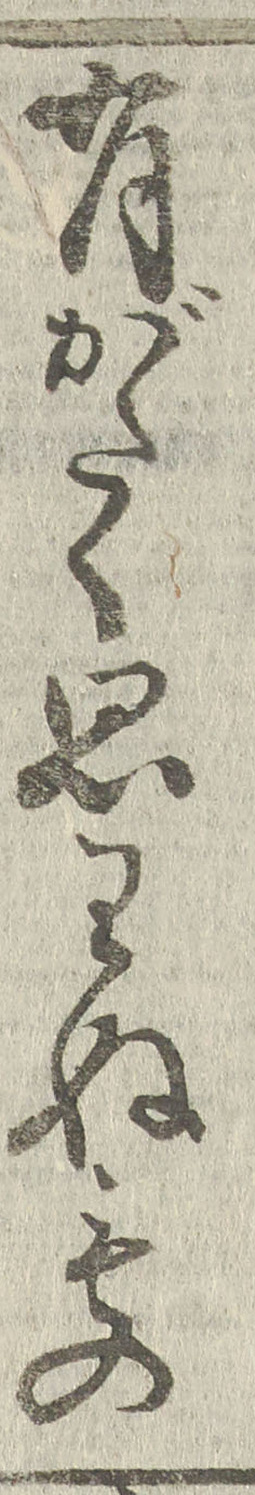有がたく思わぬもの
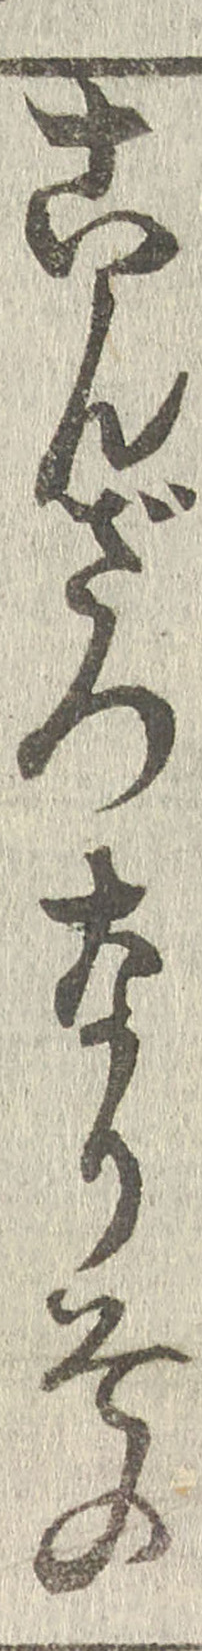こんざつなりその
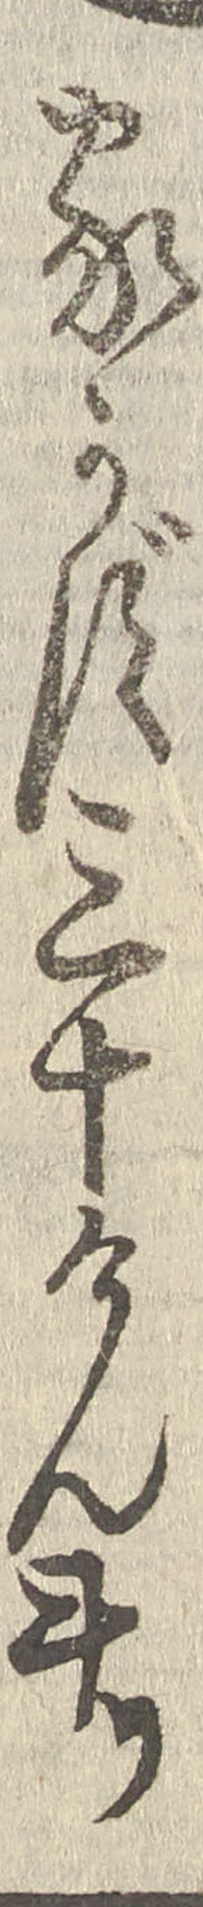家かず三十けん斗り
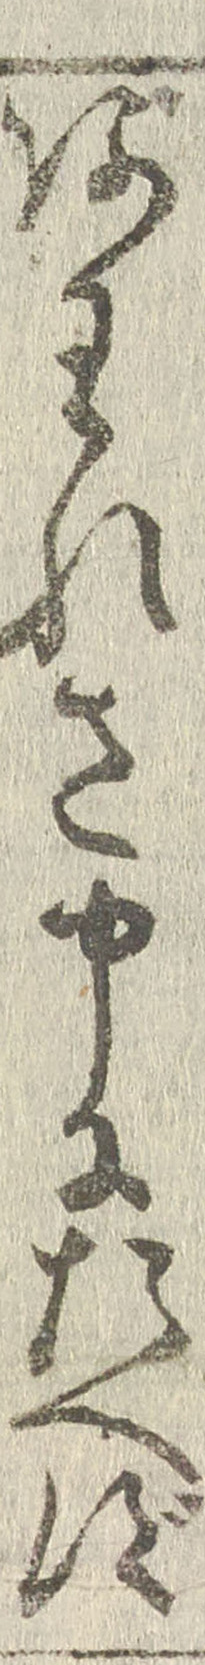あわれさ申にたへず
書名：諸国大地震大津波 三編
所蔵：東京大学総合図書館 General Library in the University of Tokyo, JAPAN
